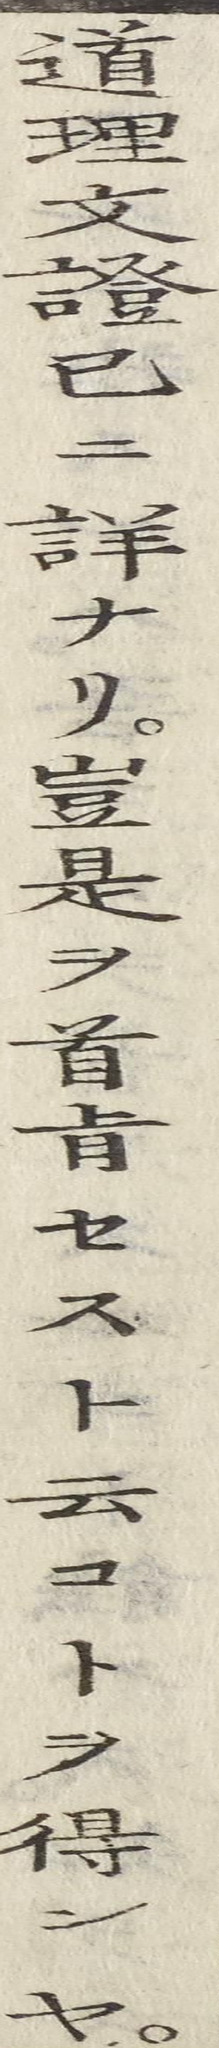道理文証已ニ詳ナリ。豈是ヲ首肯セスト云コトヲ得ンヤ。
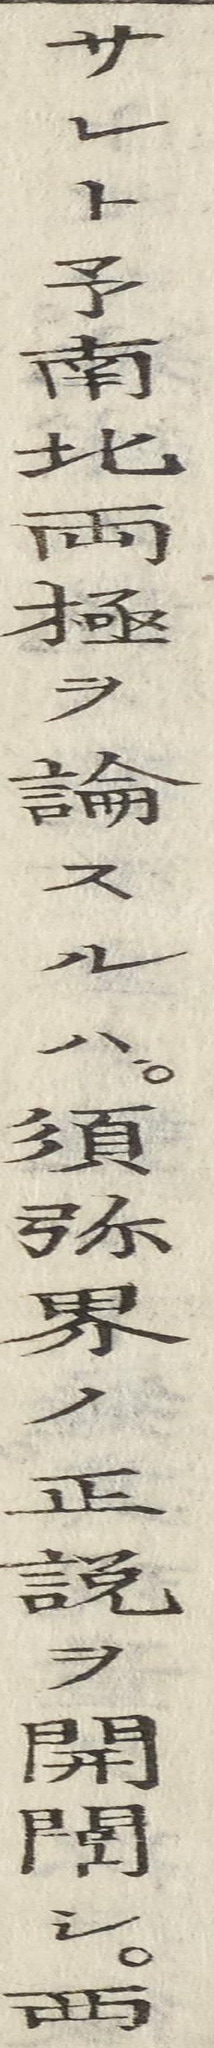サレト予南北両極ヲ論スルハ。須弥界ノ正説ヲ開闡？シ。西
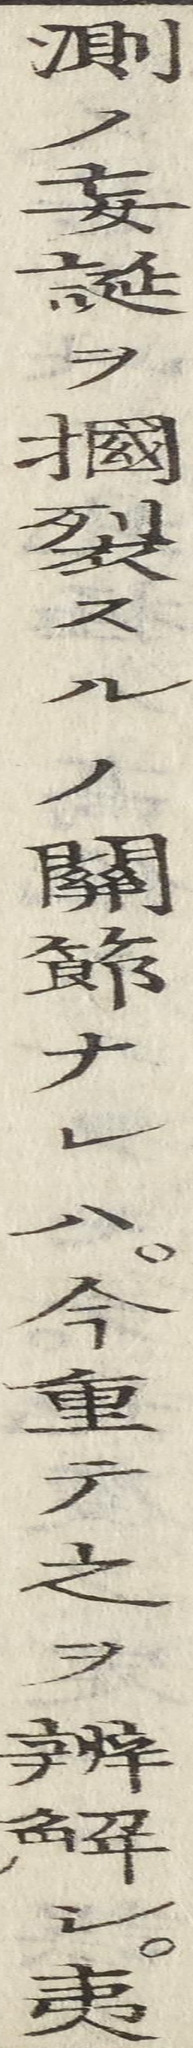測ノ妄誕ヲ掴裂スルノ関節ナレハ。今重テ之ヲ弁解シ。夷
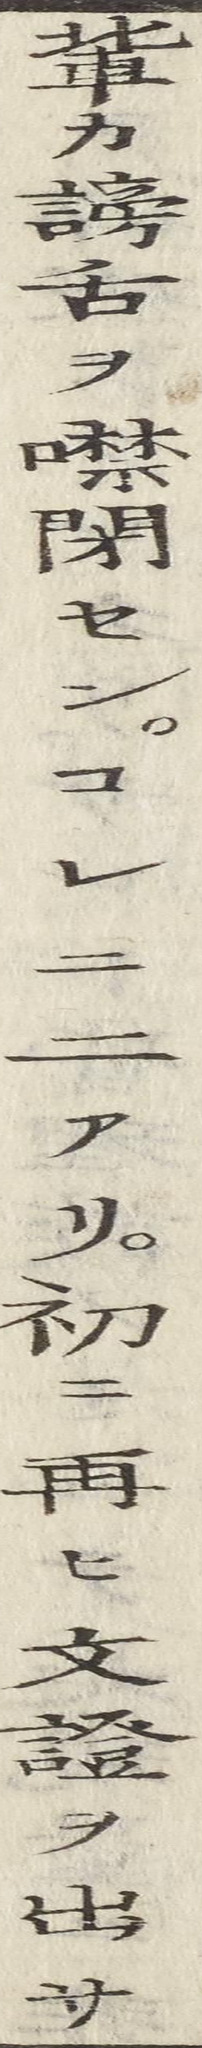軰カ謗舌ヲ噤閉セン。コレニニアリ。初ニ再ヒ文証ヲ出サ
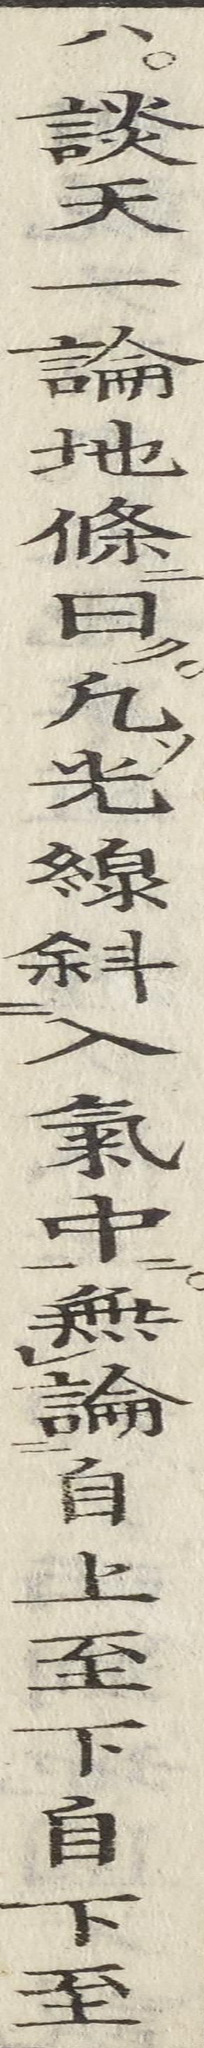ハ。談天一論地条曰。凡光線斜ニ入気中。無論ニ自上至下自下至
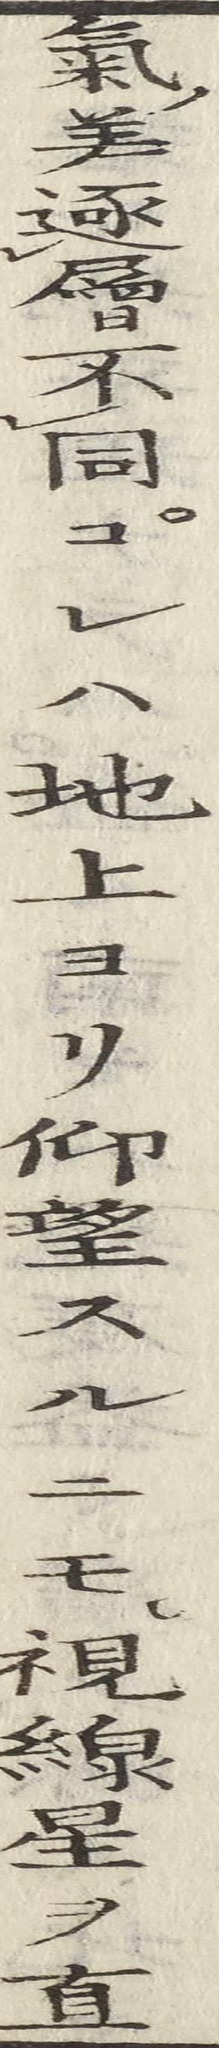気差遂層不同。コレハ地上ヨリ仰望スルニモ。視線星ヲ直
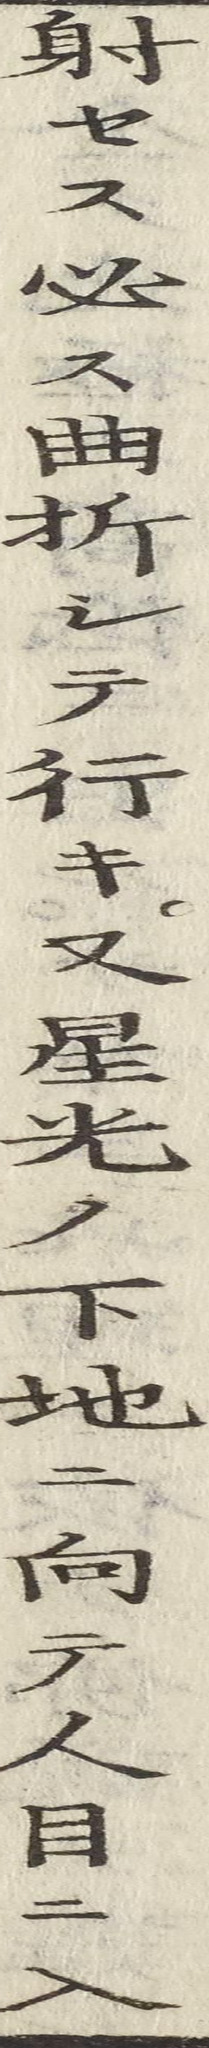射セス必ス曲折シテ行キ。又星光ノ下地ニ向テ人目ニ入
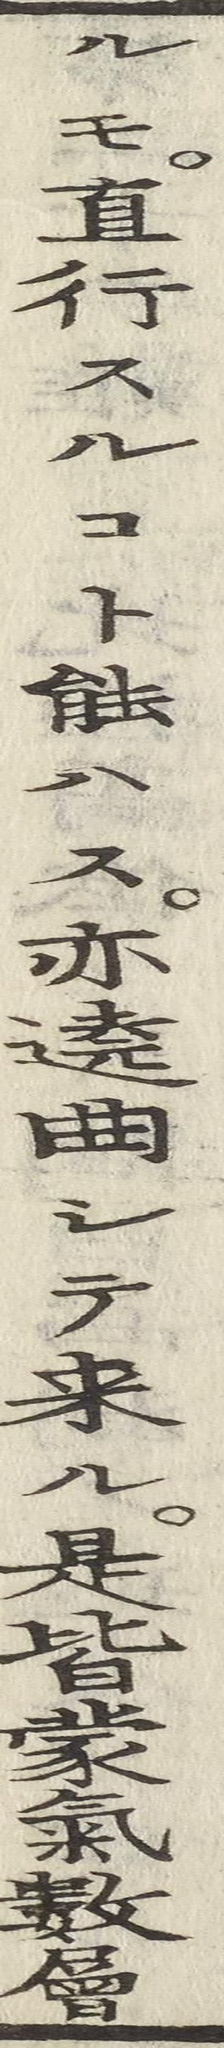ルモ。直行スルコト能ハス。亦遶曲シテ来ル。是皆蒙気数層
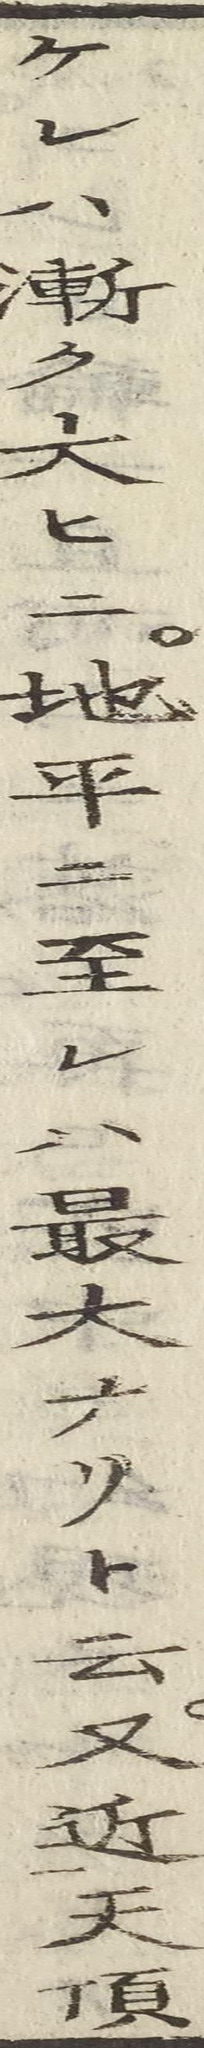ケレハ漸ク大ヒニ。地平ニ至レハ最大ナリト云。又近ニ天頂
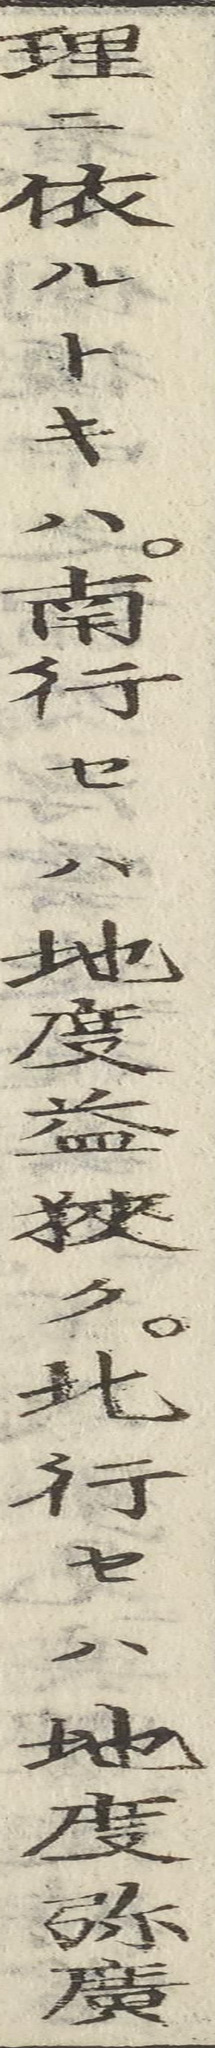理ニ依ルトキハ。南行セハ地度益狭ク。北行セハ地度弥広
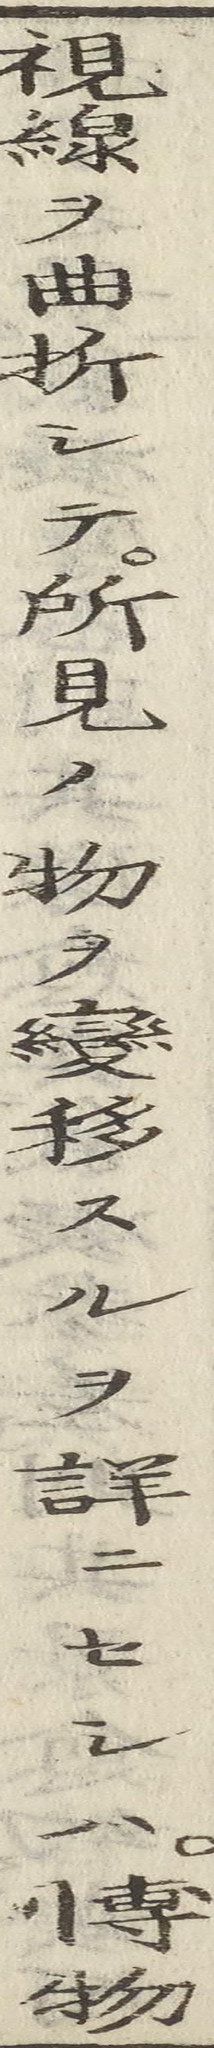視線ヲ曲折シテ。所見ノ物ヲ変移スルヲ詳ニセシハ。慱物
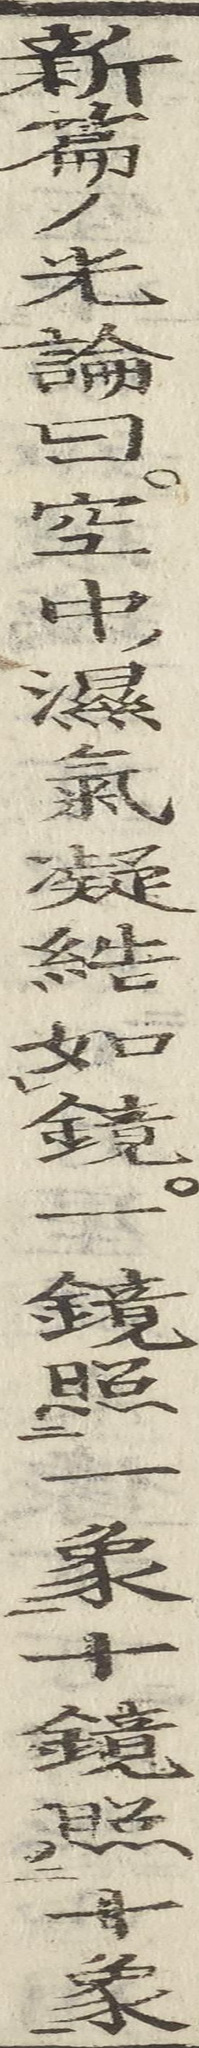新篇ノ光論曰。空中湿気凝結如鏡。一鏡照ニ一象十鏡照ニ十象。
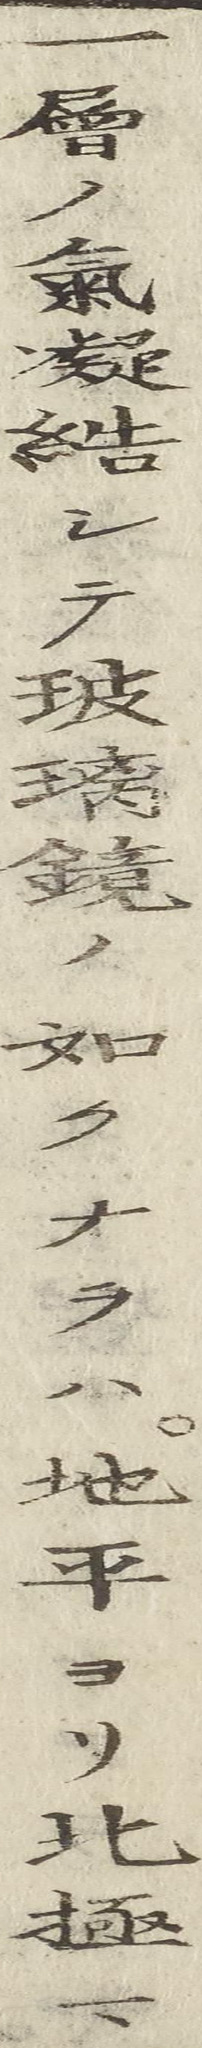一層ノ気凝結シテ玻璃鏡ノ如クナラハ。地平ヨリ北極マ
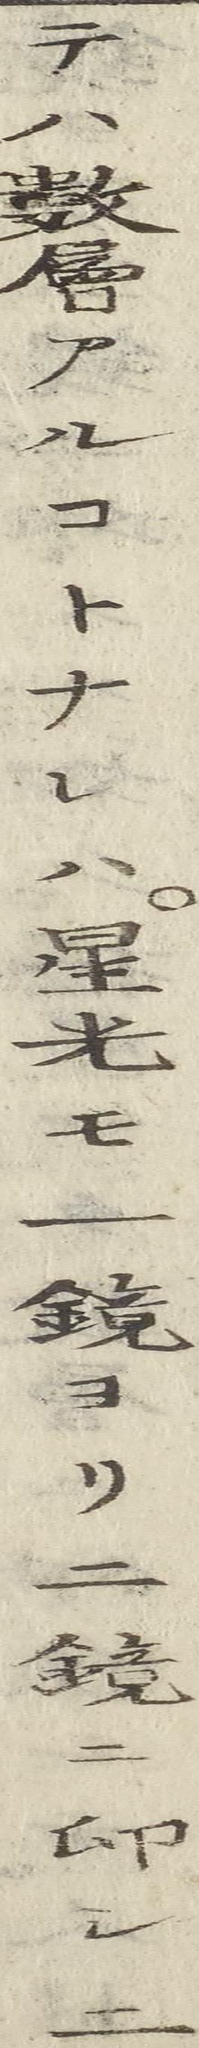テハ数層アルコトナレハ。星光モ一鏡ヨリ二鏡ニ卬シニ

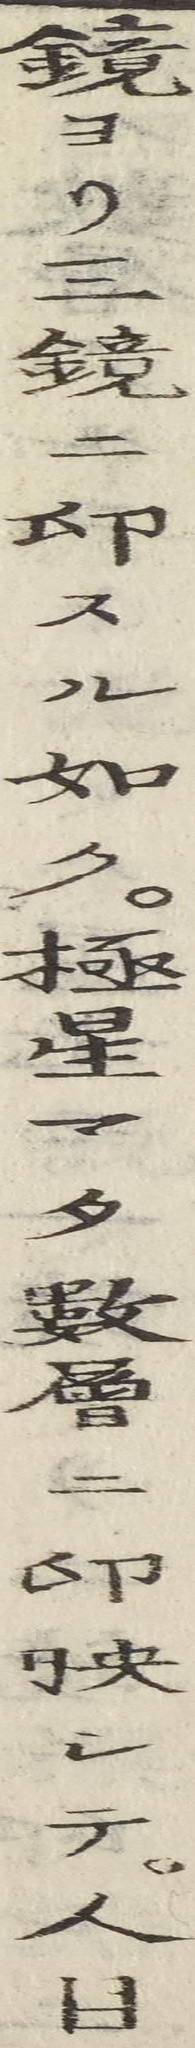鏡ヨリ三鏡ニ卬スル如ク。極星マタ数層ニ卬映シテ。人目
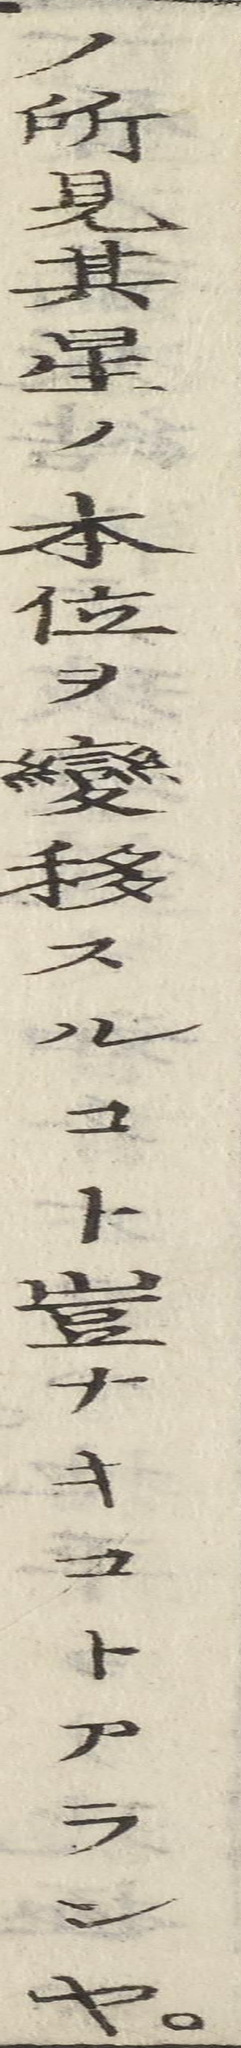ノ所見其星ノ本位ヲ変移スルコト豈ナキコトアランヤ。
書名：護法新論　二編　中
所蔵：東京大学地震研究所図書室 Earthquake Research Institute Library, The University of Tokyo, JAPAN
